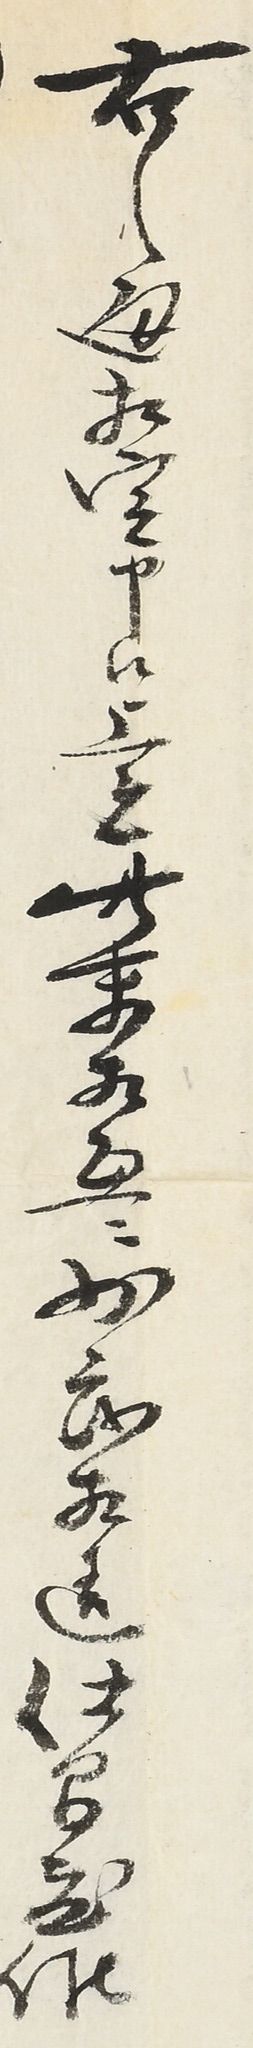右之通相定申候上者此末相互ニ少茂相違仕間敷候
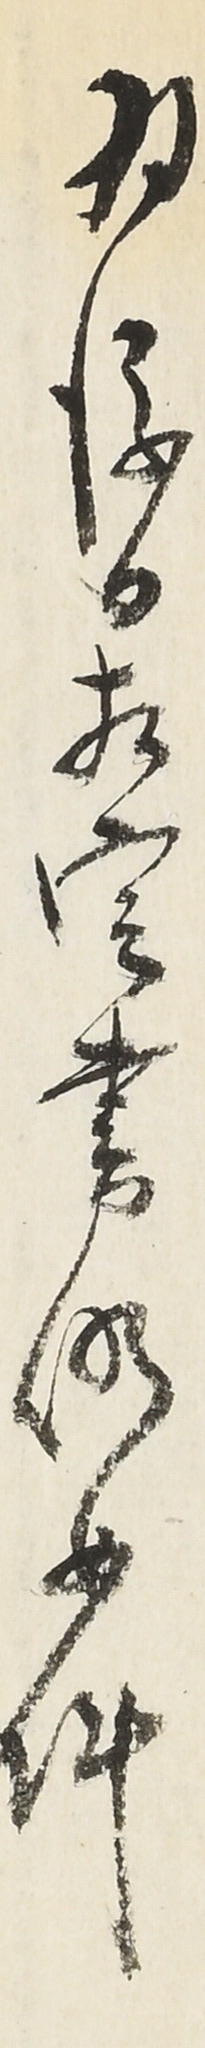為後日相定書仍如件
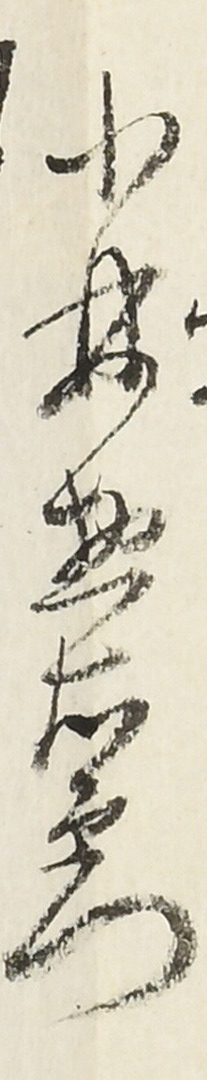小林惣右衛門
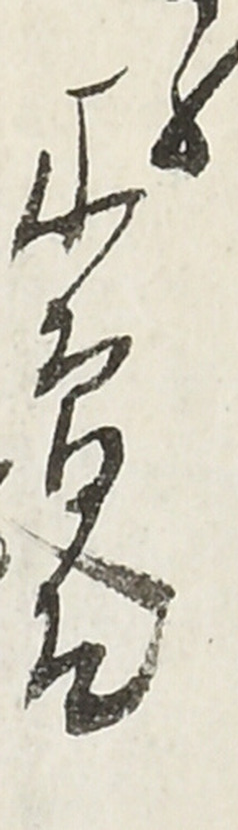木曽屋
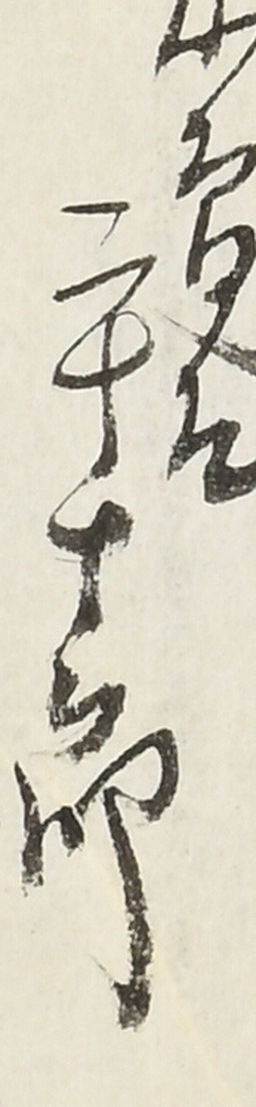平十郎
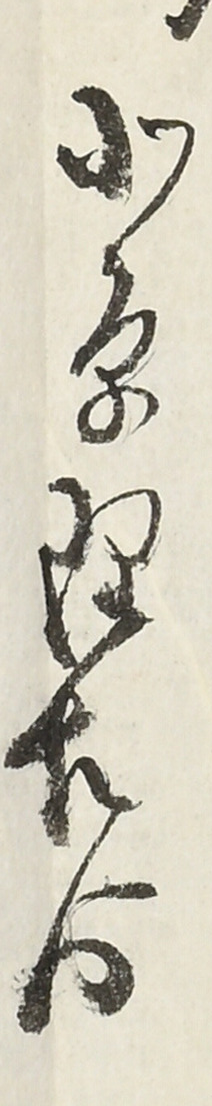北原理左衛門

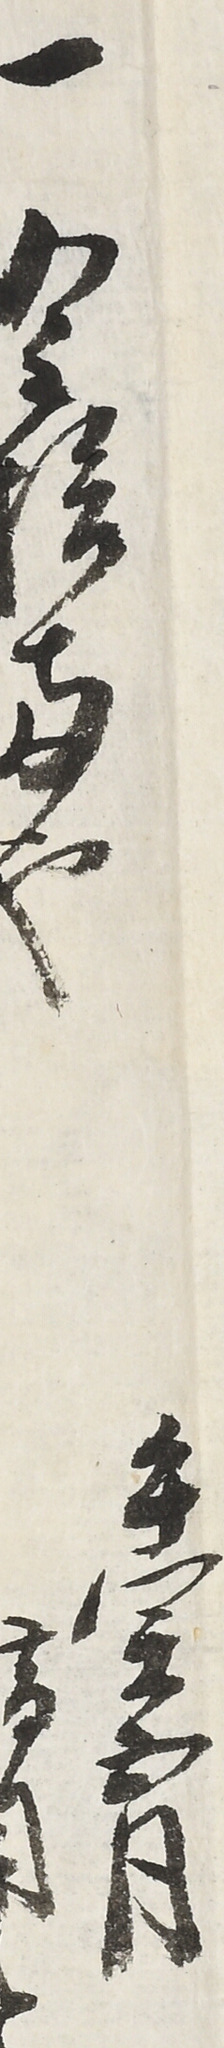一金拾両也午閏五月
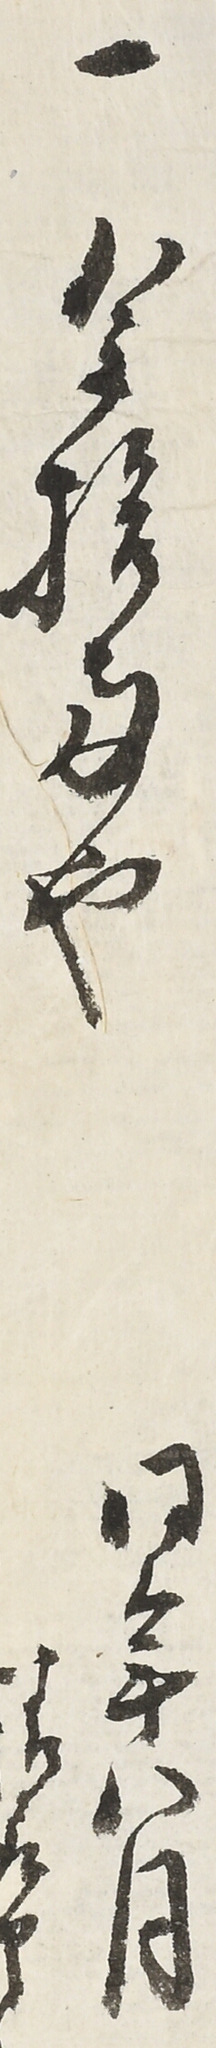一金拾両也同年八月
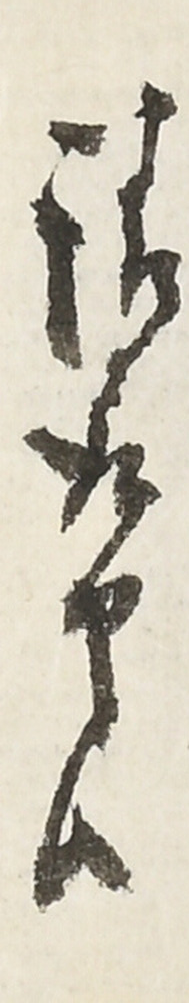請取申候
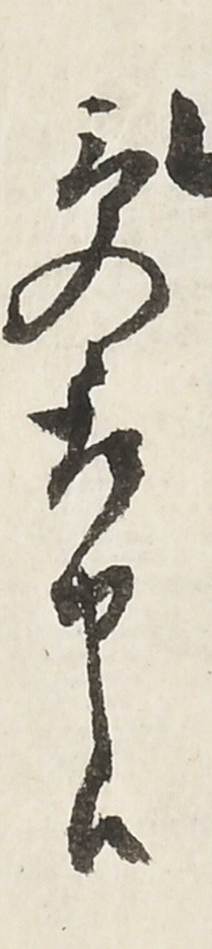受取申候
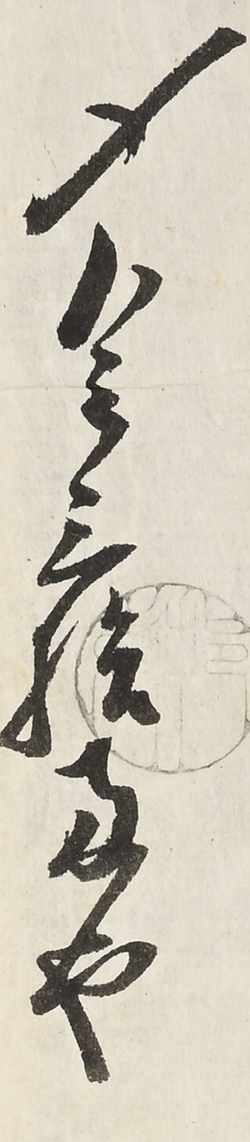〆金三拾両也
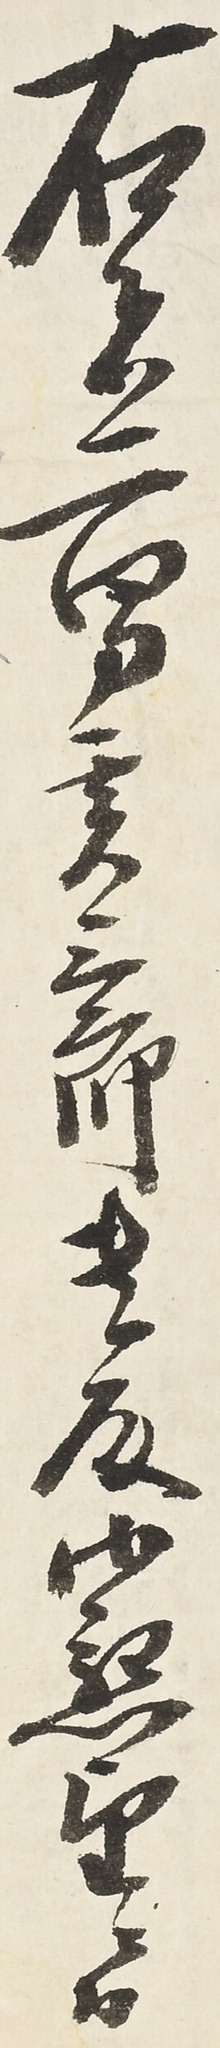右者二男亥三郎貴殿御懇望ニ而
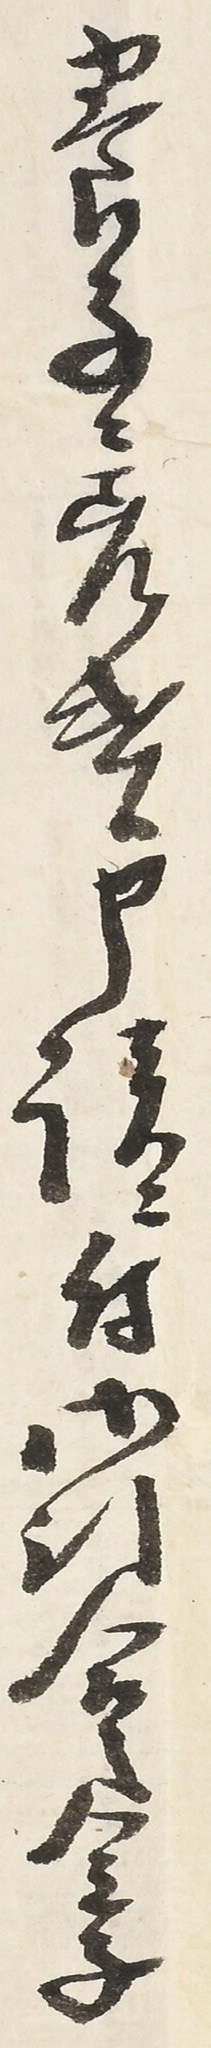養子ニ差遣候申談ニ付御引合之金子
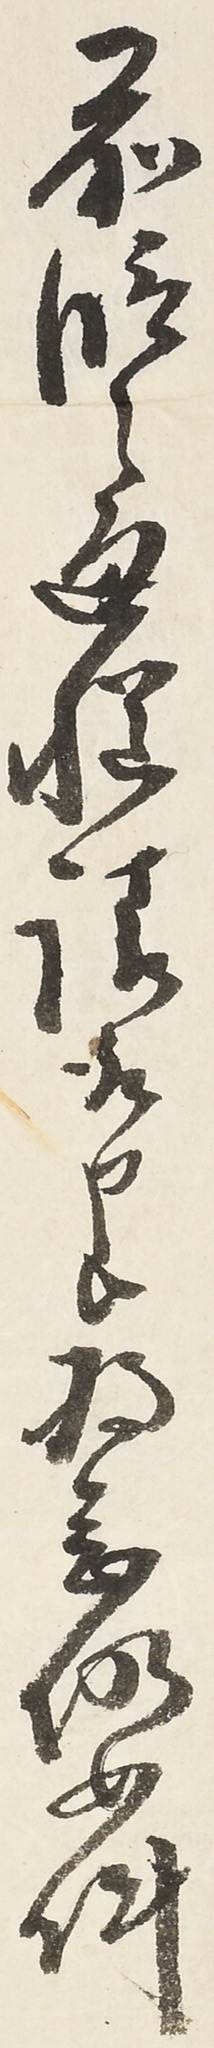前段之通慥請取申候為念仍如件
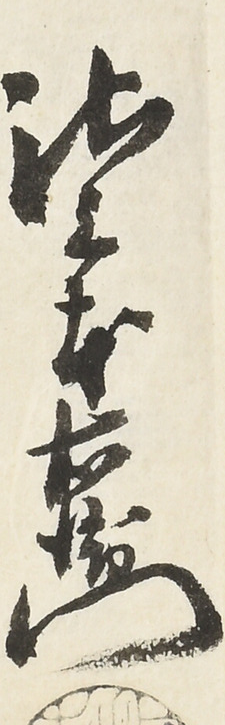池上本右衛門㊞
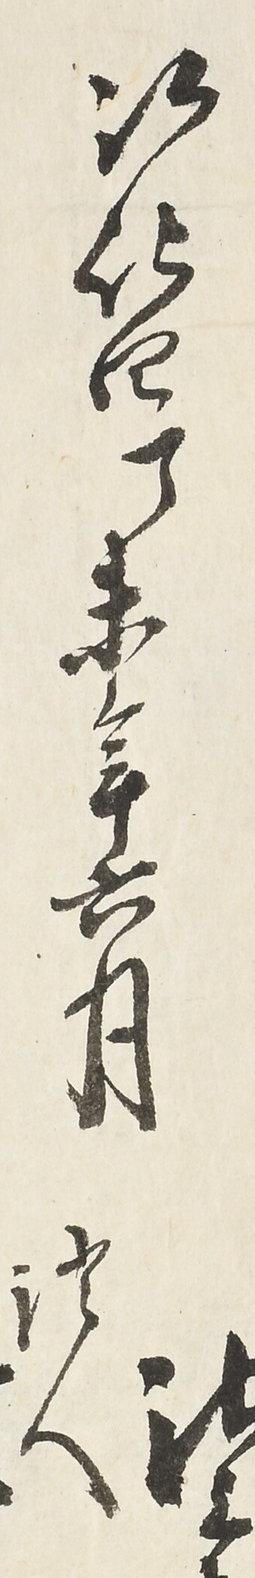弘化四丁未年六月証人
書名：相定申一札之事
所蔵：伊那市立高遠町図書館・合同会社AMANE
